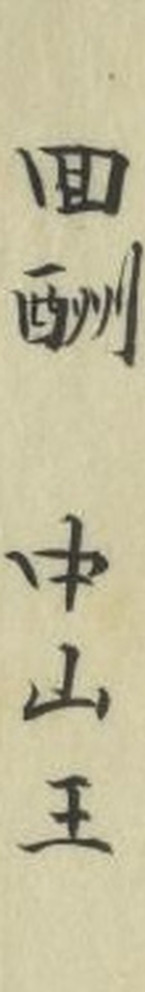回酬中山王
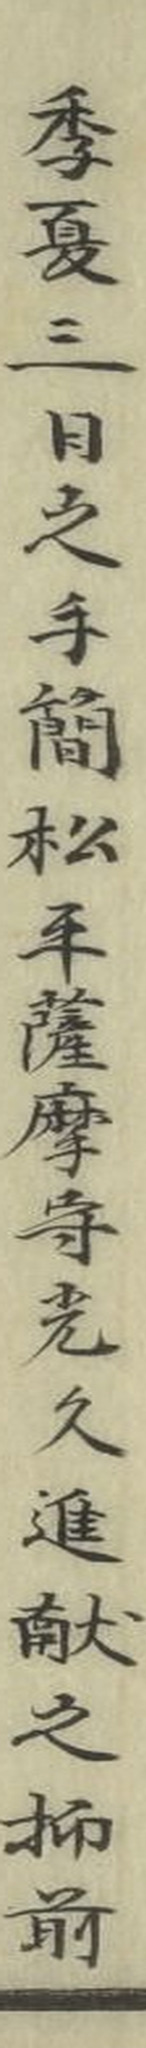季夏三日之手簡松平薩摩守充久進献之抑前
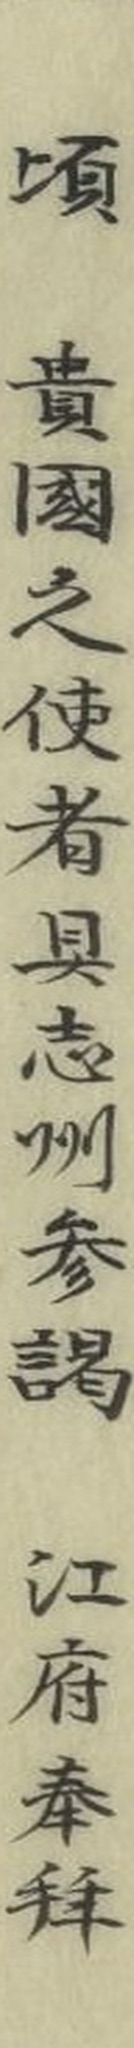頃貴国之使者具志州参謁江府奉拝
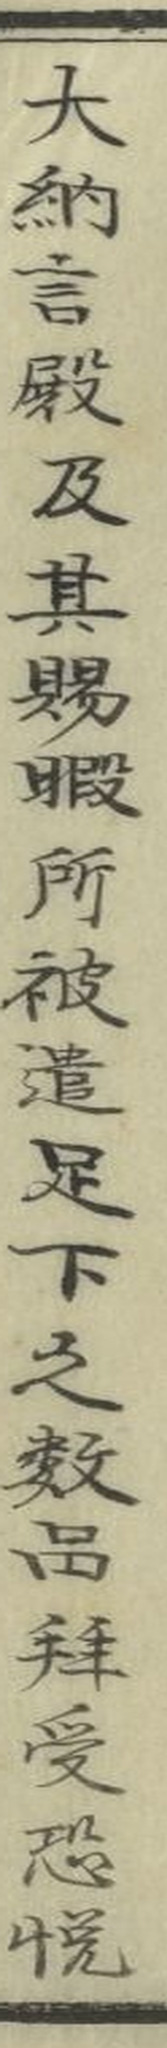大納言殿及其賜暇所被遣足下之数品拝受恐悦
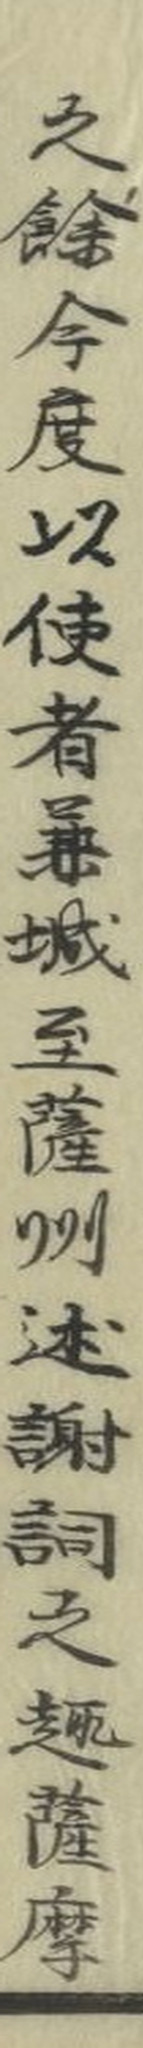之余今度以使者兼城至薩州述謝詞之趣薩摩

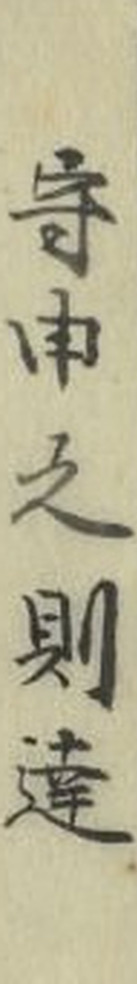守申之則達
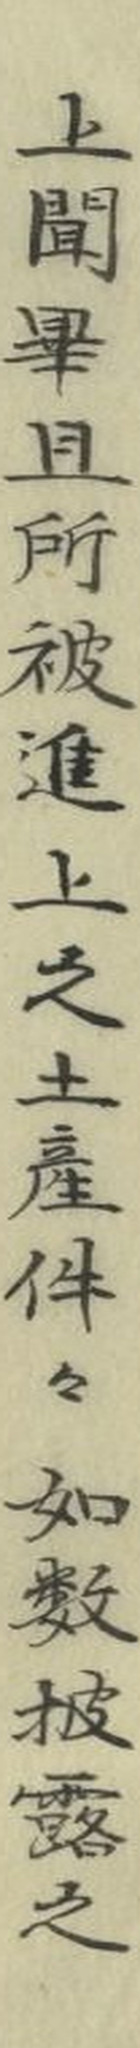上聞畢且所被進上之土産件々如数披露之
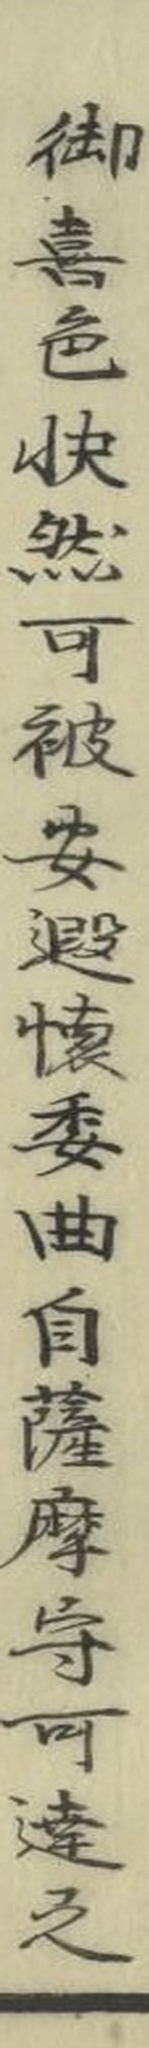御喜色快然可被安遐懐委曲自薩摩守可達之
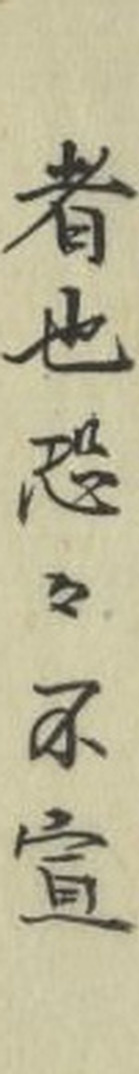者也恐々不宣
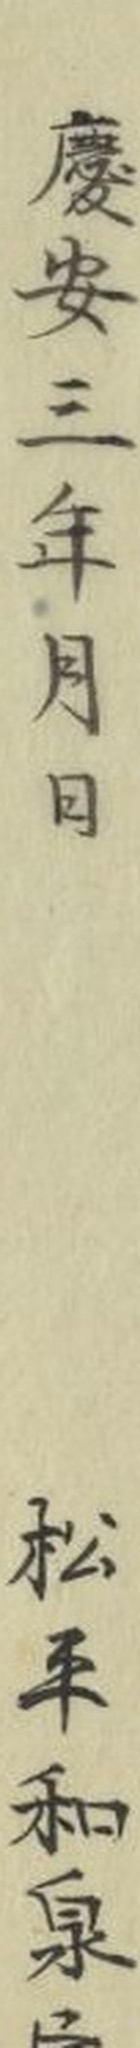慶安三年月日松平和泉守
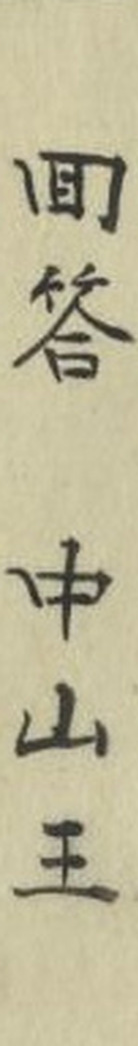回答中山王
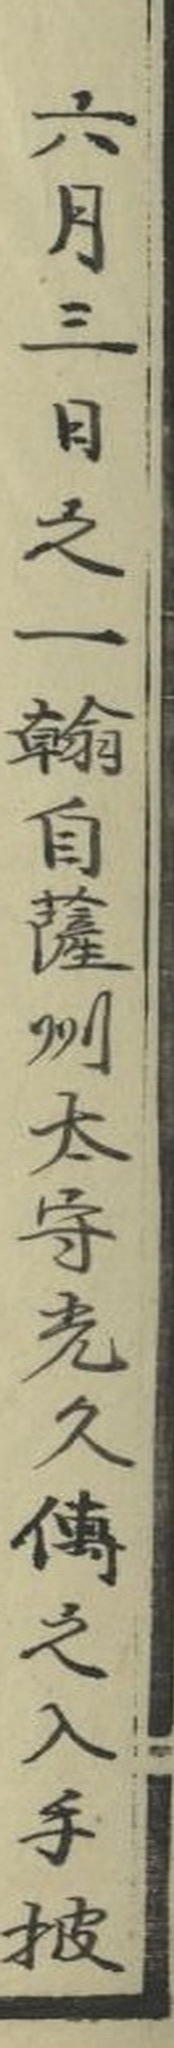六月三日之一翰自薩州太守充久伝之入手披
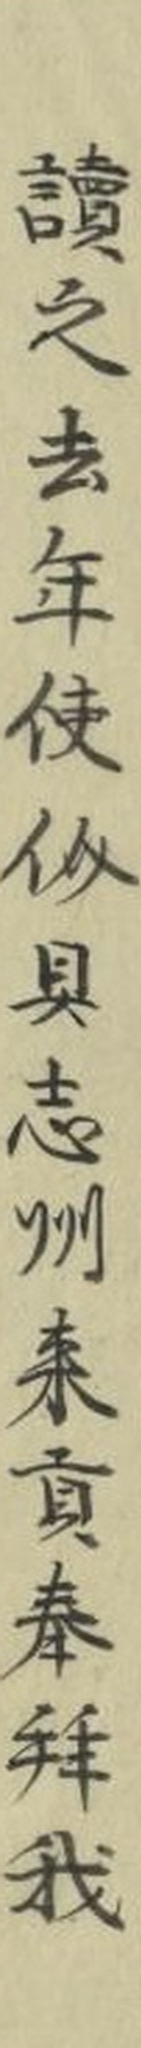読之去年子使价具志州来貢奉拝我
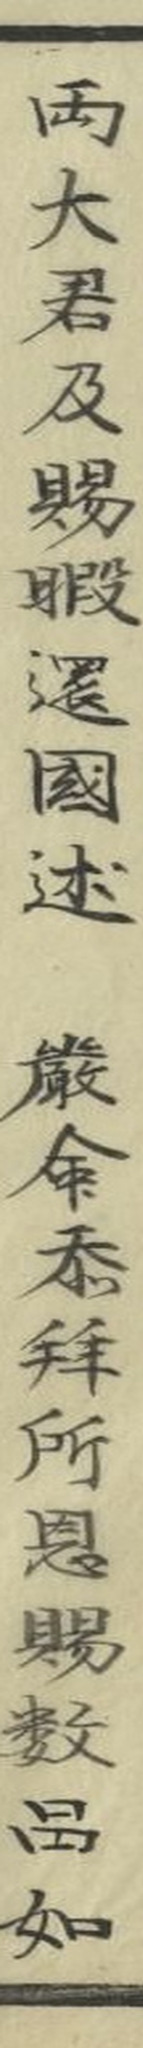両大君及賜暇還国述厳命忝拝所恩賜数品如
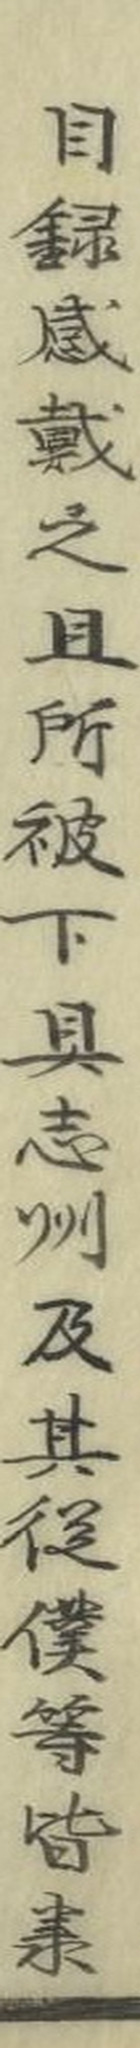目録感載之且所被下具志州及其従僕等皆泰
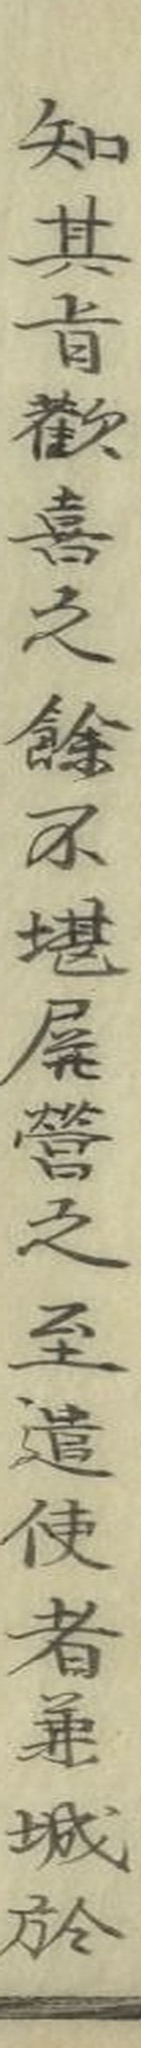知其旨歓喜之余不堪屏営之至遣使者兼城於
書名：琉球往来（上）
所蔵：University of the Ryukyus Library
